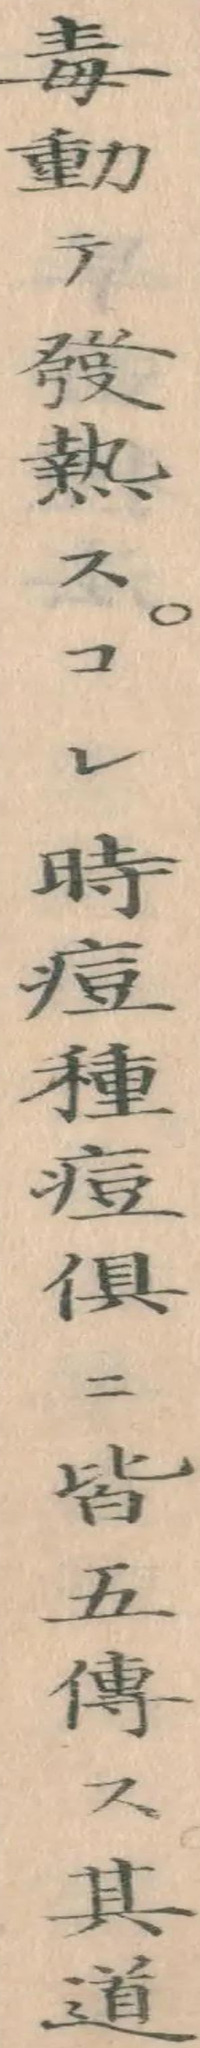毒動テ発熱ス。コレ時痘種痘倶ニ皆五伝ス。其道
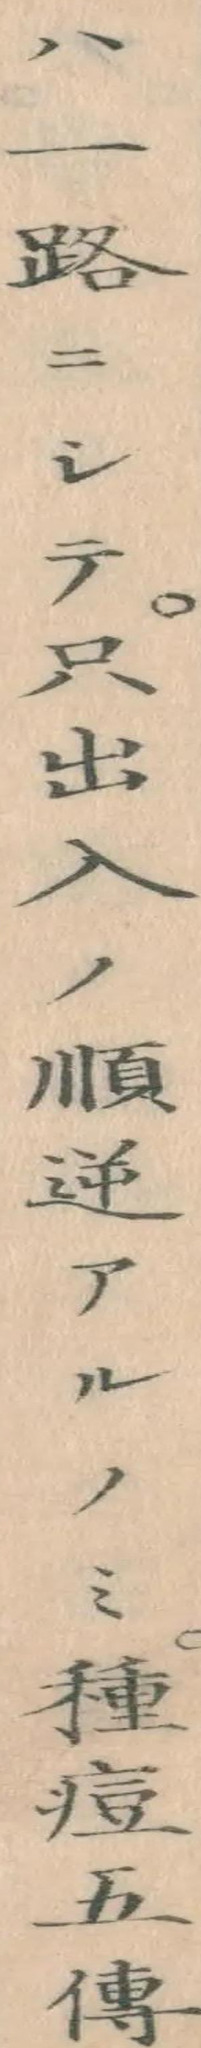ハ一路ニシテ。只出入ノ順逆アルノミ。種痘五伝
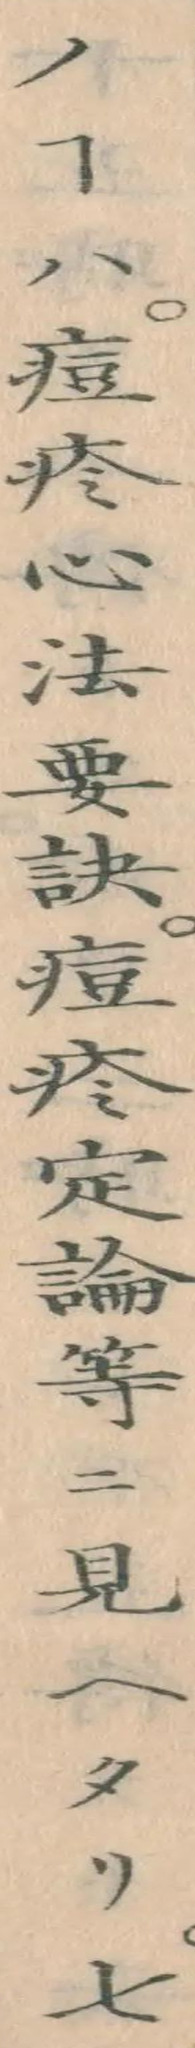ノヿハ。痘疹心法要訣。痘疹定論等ニ見ヘタリ。七
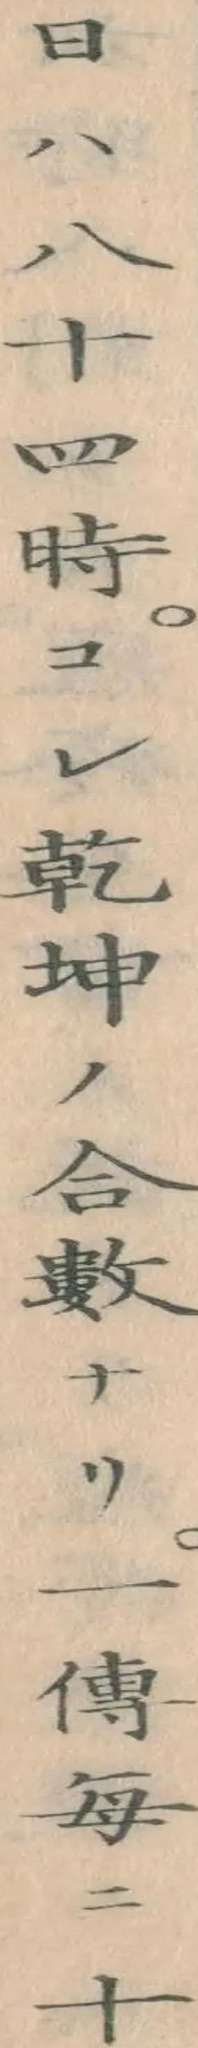日ハ八十四時。コレ乾坤ノ合数ナリ。一伝毎ニ十

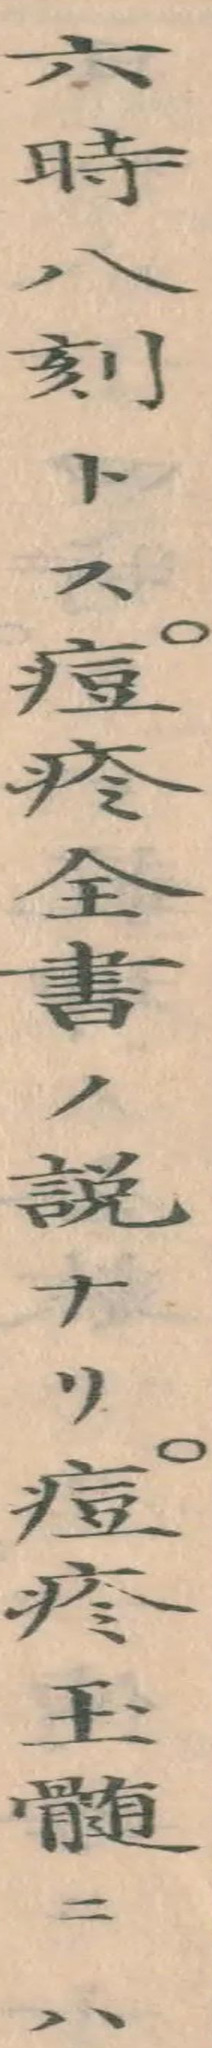六時八刻トス。痘疹全書ノ説ナリ。痘疹玉髄ニハ
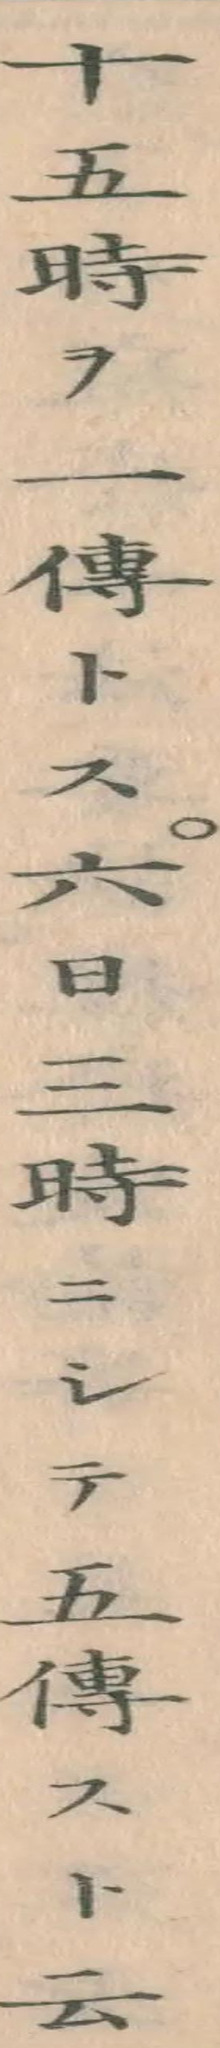十五時ヲ一伝トス。六日三時ニシテ五伝スト云
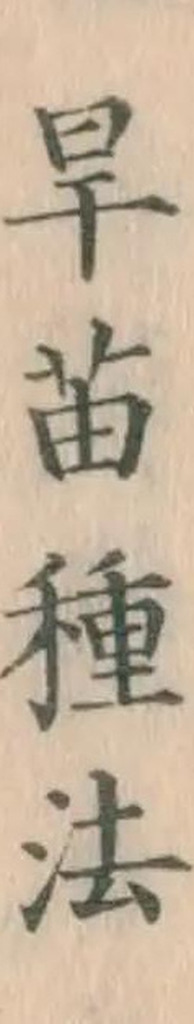早苗種法
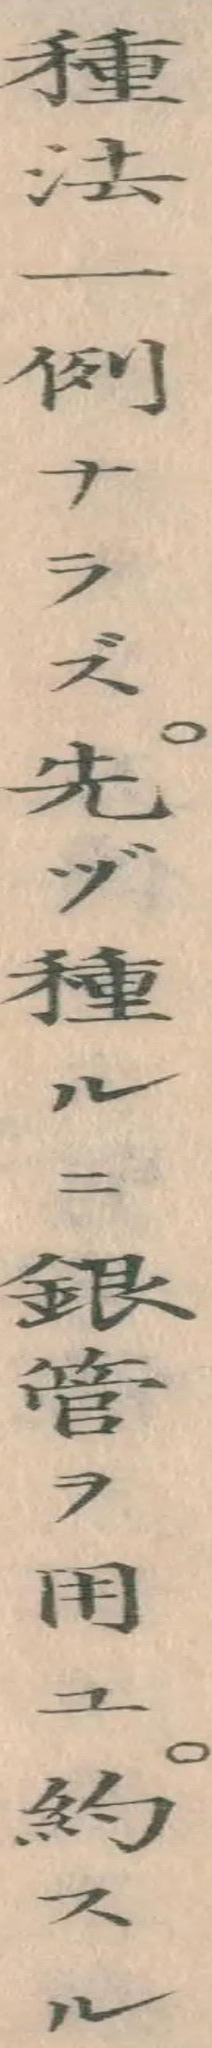種法一例ナラズ。先ヅ種ルニ銀管ヲ用ユ。約スル
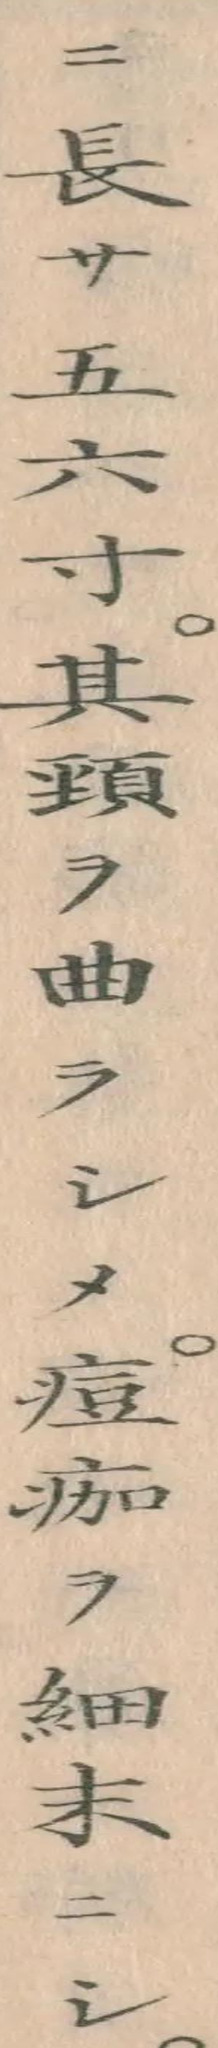ニ長サ五六寸。其頸ヲ曲ラシメ。痘痂ヲ細末ニシ。
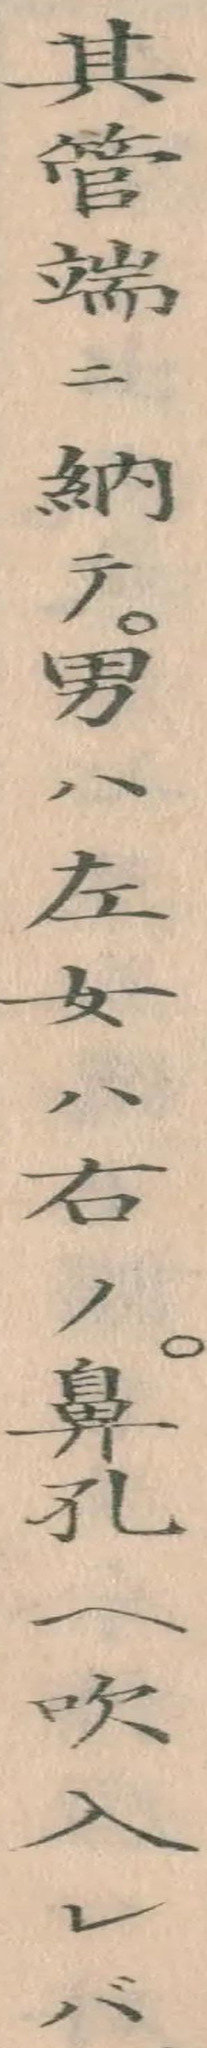其管端ニ納テ。男ハ左女ハ右ノ。鼻孔ヘ吹入レバ。
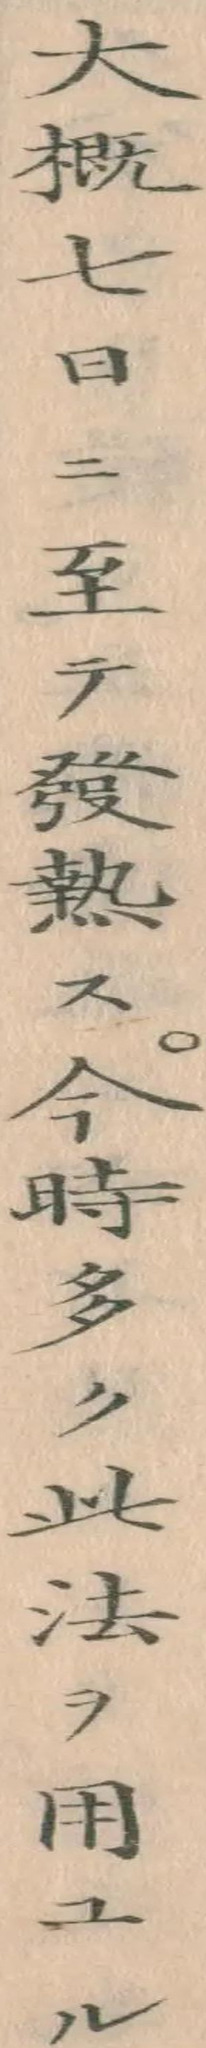大概七日ニ至テ発熱ス。今時多ク此法ヲ用ユル
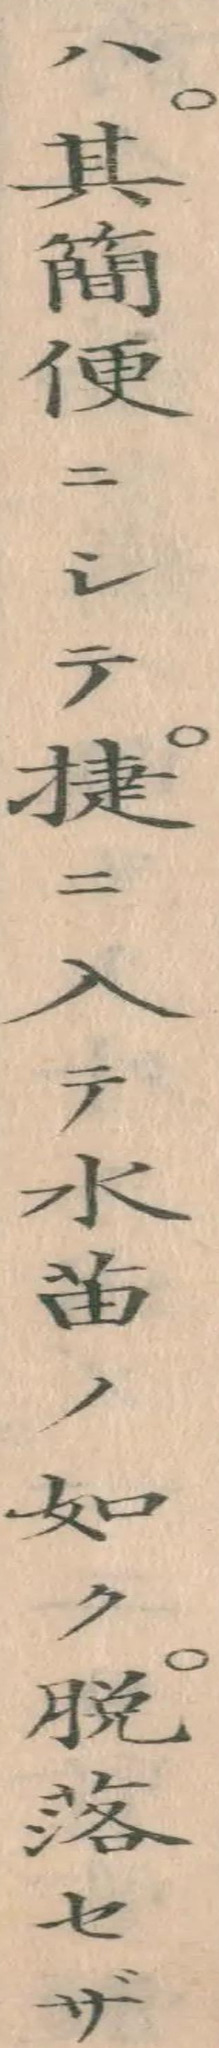ハ。其簡便ニシテ。捷ニ入テ水苗ノ如ク。脱落セザ
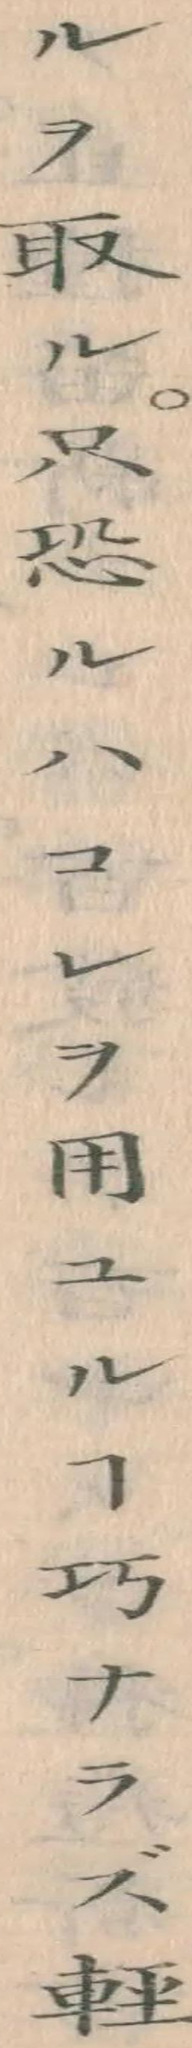ルヲ取ル。只恐ルハコレヲ用ユルヿ巧ナラズ。軽
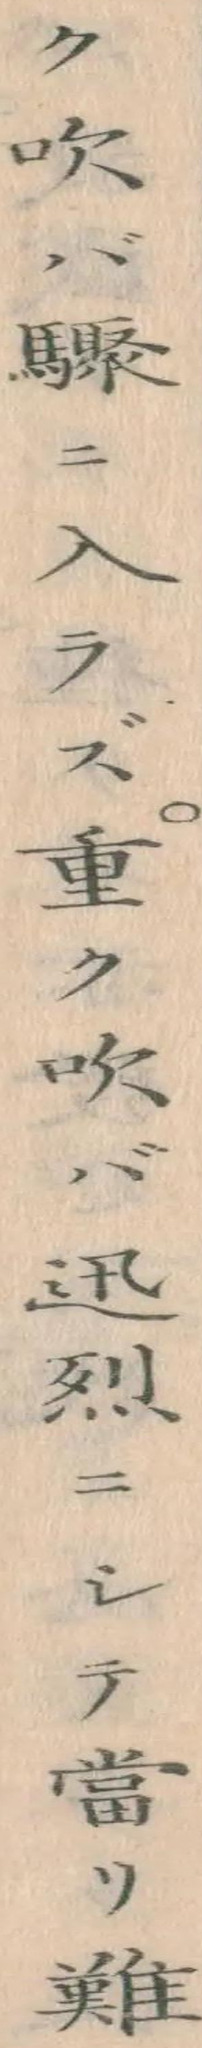ク吹バ驟ニ入ラズ。重ク吹バ迅烈ニシテ当リ難
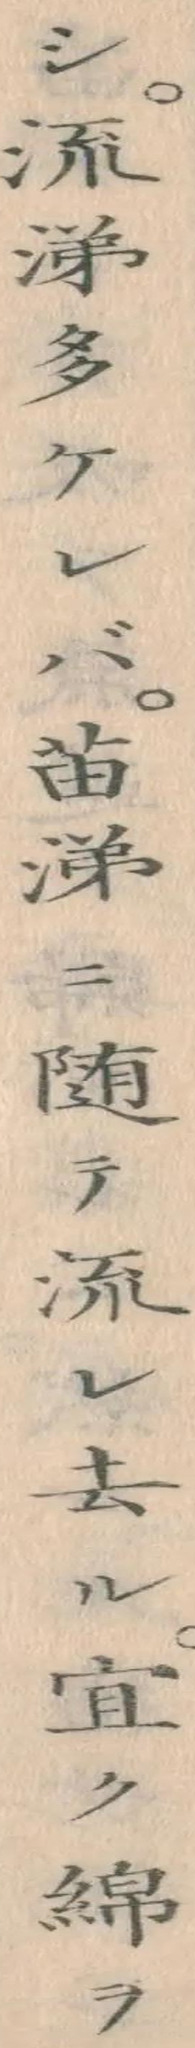シ。流涕多ケレバ。苗涕ニ随テ流レ去ル。宜ク綿ヲ
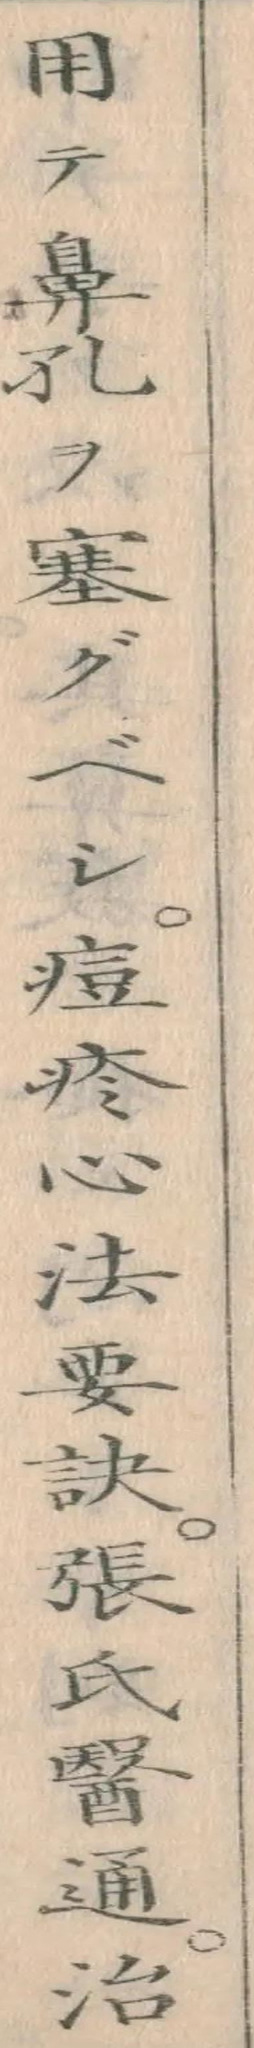用テ鼻孔ヲ塞グベシ。痘疹心法要訣。張氏医通。治
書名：種痘弁義
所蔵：国立国会図書館 National Diet Library, JAPAN
